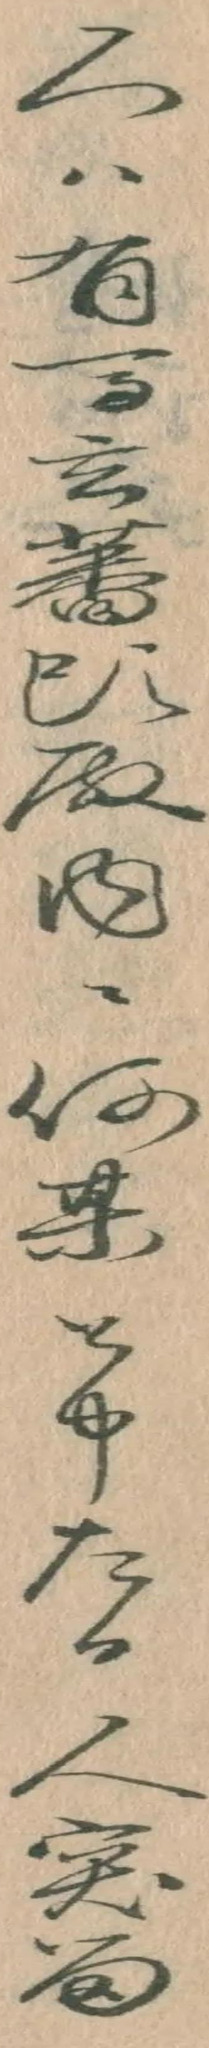人は有馬玄蕃頭殿内に何連と申たる人突留
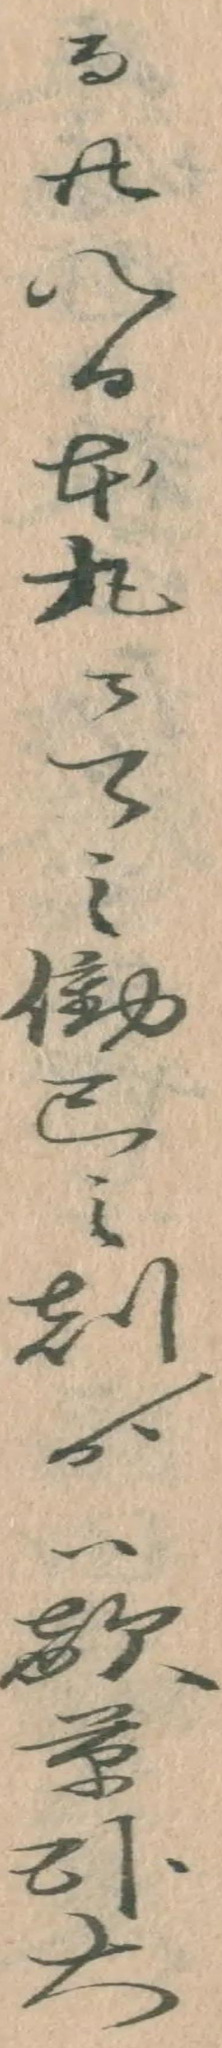る廿八日本丸にて之働巳之刻ゟは敵草臥大
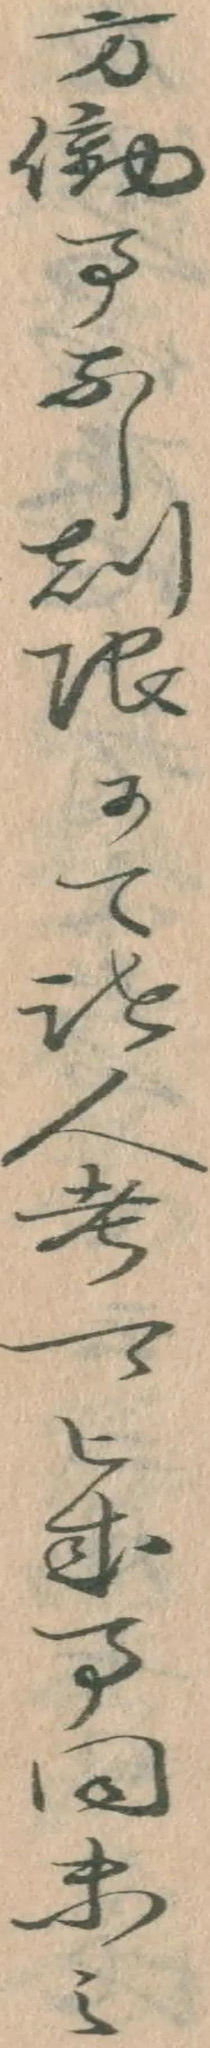宝働事なし刻限尓て諸人考可被成事同未之
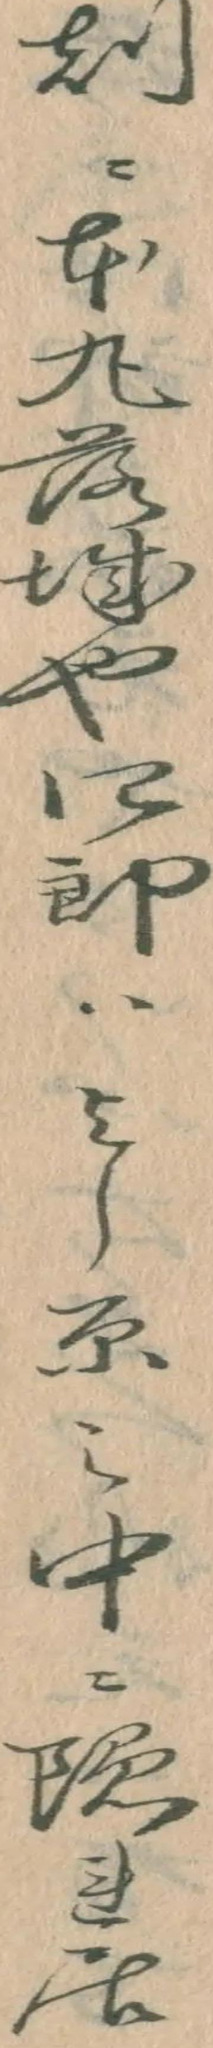刻に本丸落城也四郎は与し原之中に隠連居
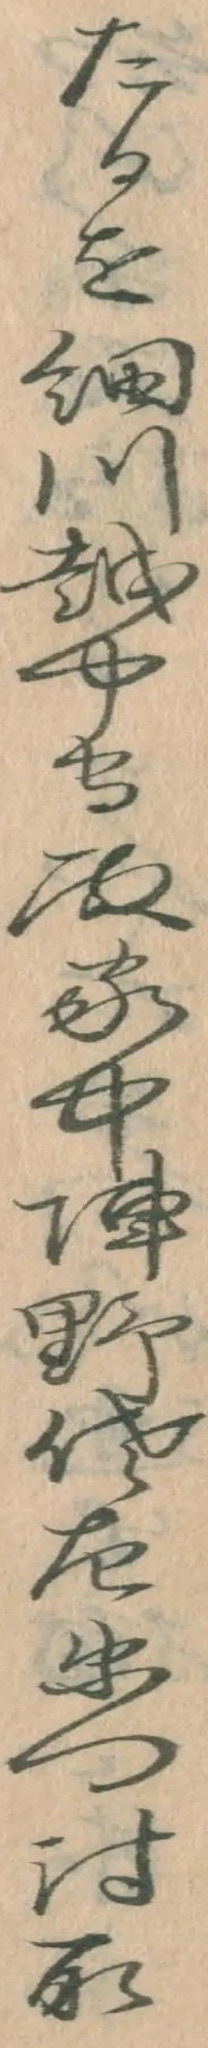たるを細川越中守殿家中陣野佐左衛門討取

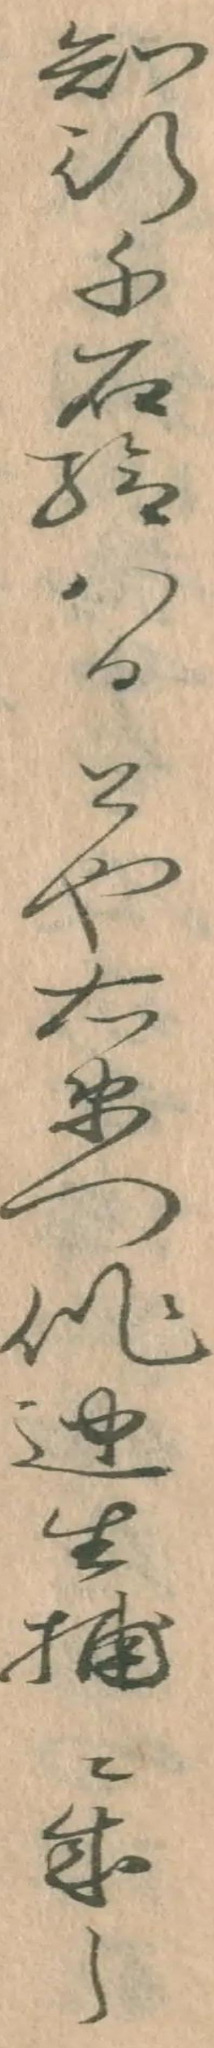知行千石給はると也右衛門作迚生捕に成し
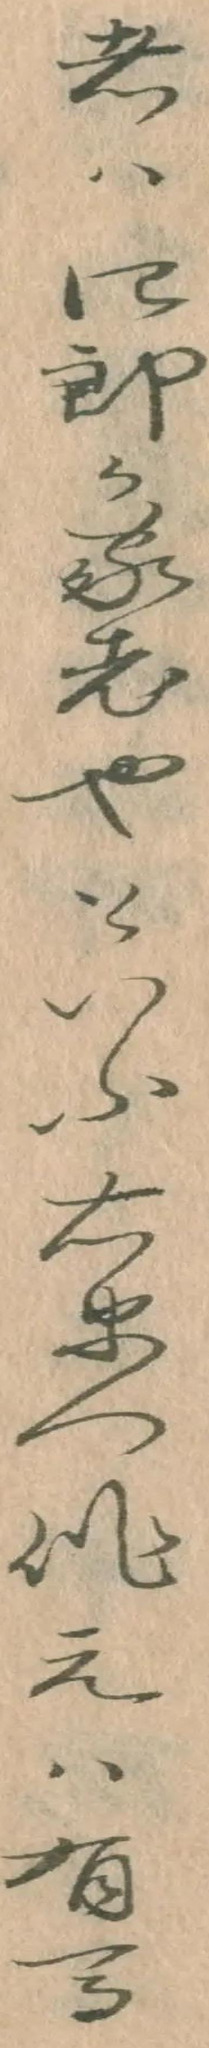者は四郎か家老やといふ右衛門作元は有馬
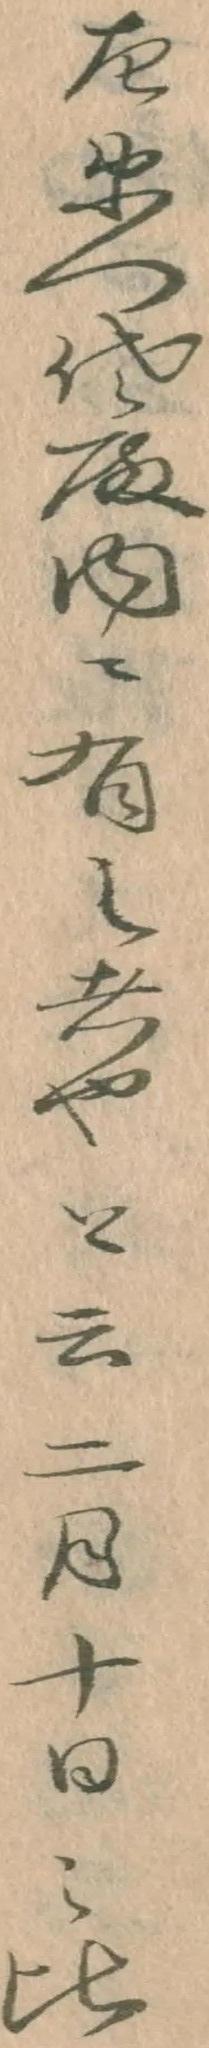左衛門佐殿内に有之者也と云二月十日之比
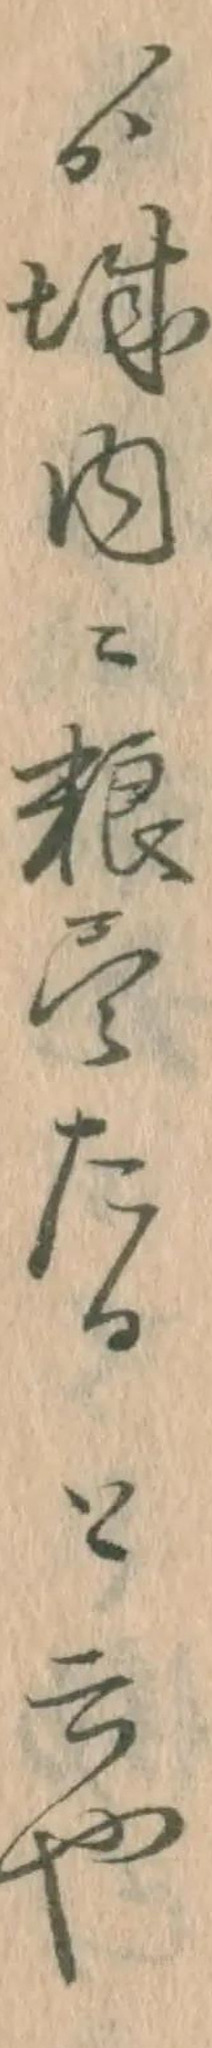ゟ城内に粮尽たると云也
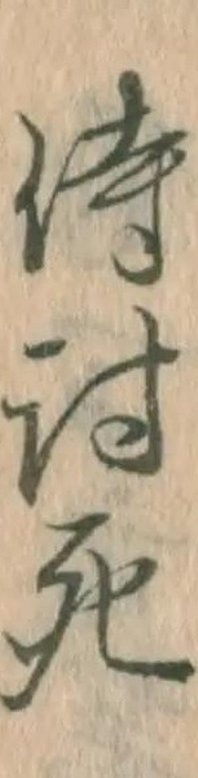侍討死
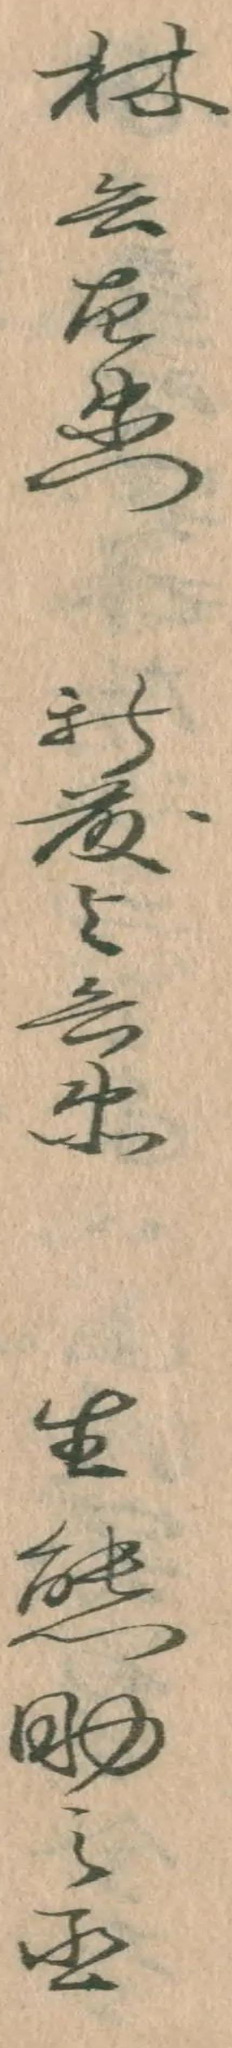林兵左衛門新藤与兵衛生熊助之丞
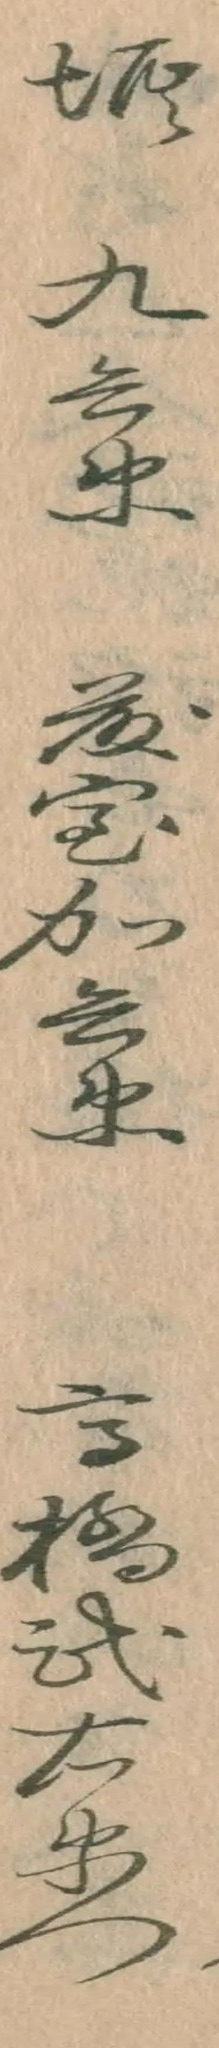堀九兵衛藤宝加兵衛高橋武右衛門
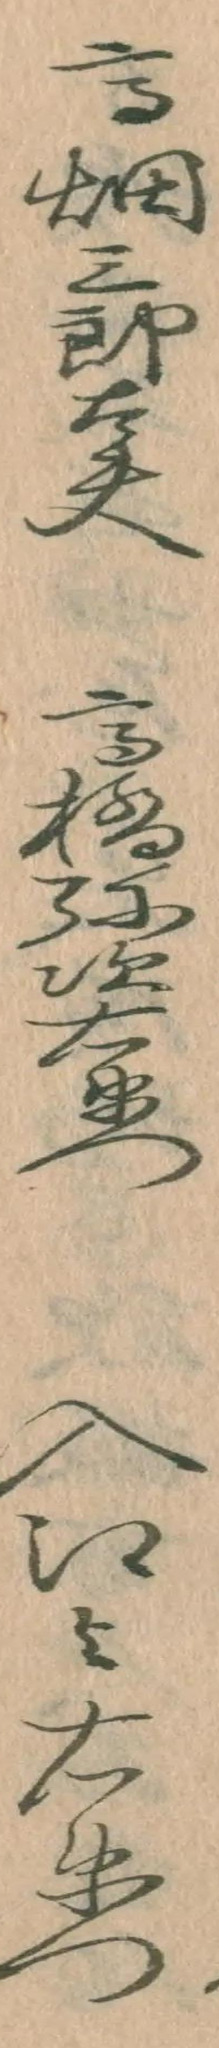高畑三郎太夫高橋弥次右衛門入江与右衛門
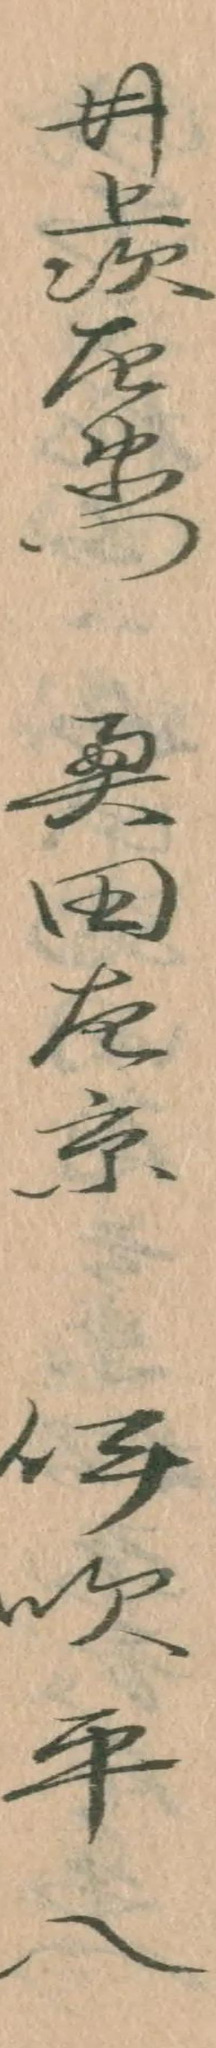井上次左衛門奥田左京伊吹平八
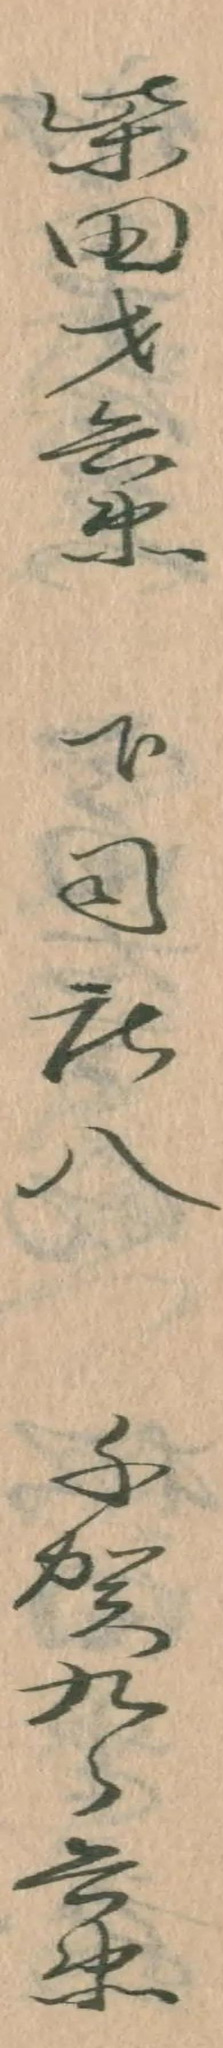柴田才兵衛下司庄八千賀九郎兵衛
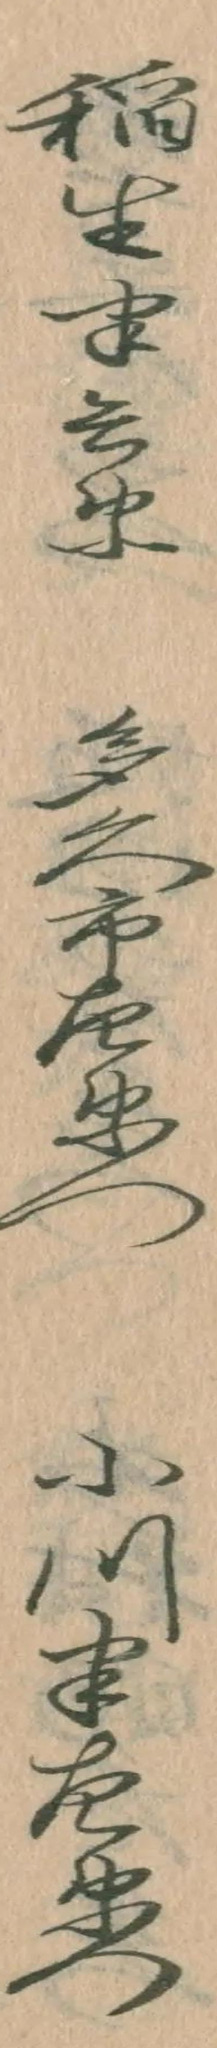稲生半兵衛多久市左衛門小川半左衛門
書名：切支丹御退治記 49巻. [9]
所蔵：国立国会図書館 National Diet Library, JAPAN
